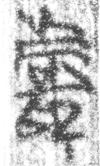○（赭）
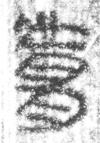膚（黸）
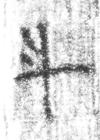之
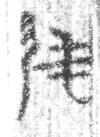純
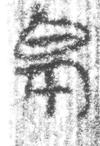帛
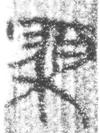○（攝）
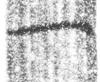一
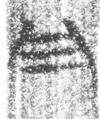丹
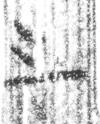之
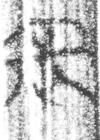衦
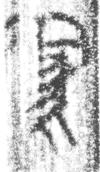緅
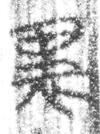裏
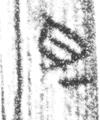組
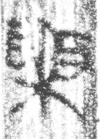○（攝）
